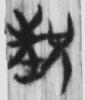○（兄）
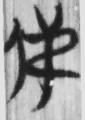俤（弟）
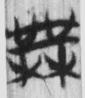無
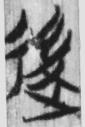○（後）
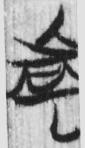者
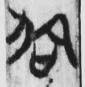卲
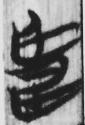良
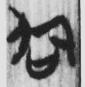卲
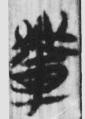𨍱（乘）
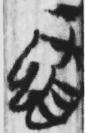縣
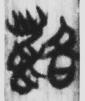○（貉）
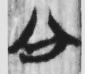公
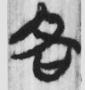各
